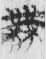無
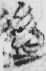○（後）
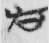右
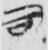司
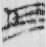馬
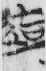适
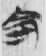命
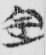定
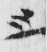之
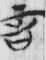言
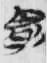{胃刀}（謂）
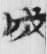戌
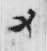又（有）
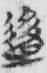○（後）
